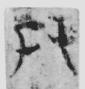幵
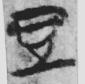豆
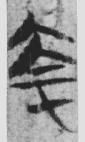亢（剛）
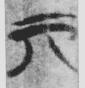亓
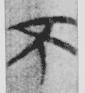不
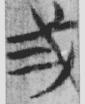弍（貳）
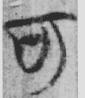可
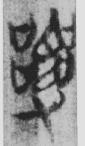亂
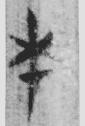本
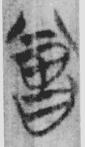曾（層）
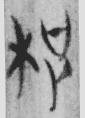枳（枝）
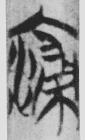{宀水帚}（侵）
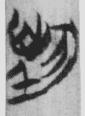{臼土刀}（毀）
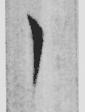丨（彰）
